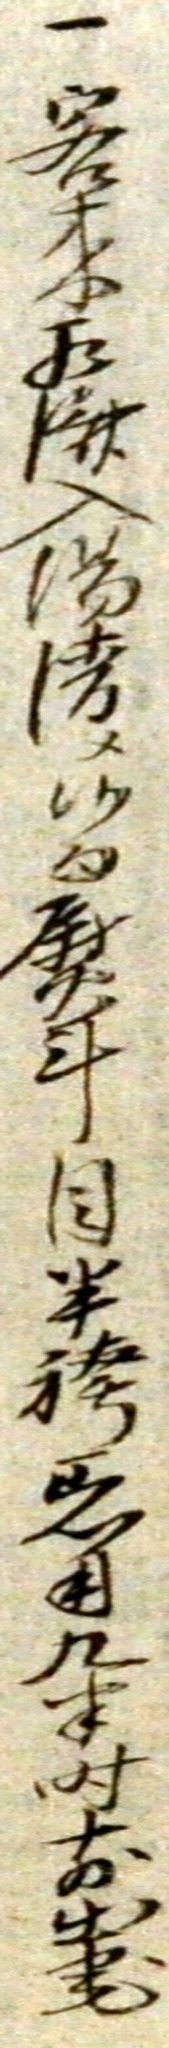一客来相済入湯清メ候而熨斗目半袴着用九半時前出宅
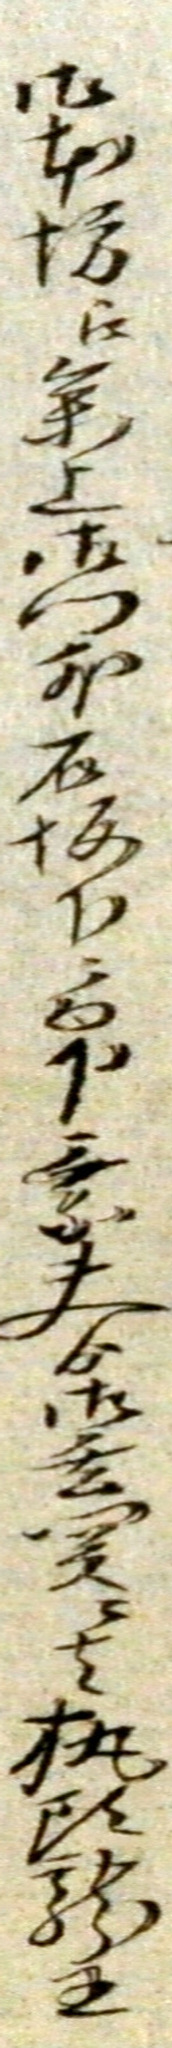御本坊江参上御門外石坂下ニ而下乗夫ゟ御玄関ニ者執頭龍王
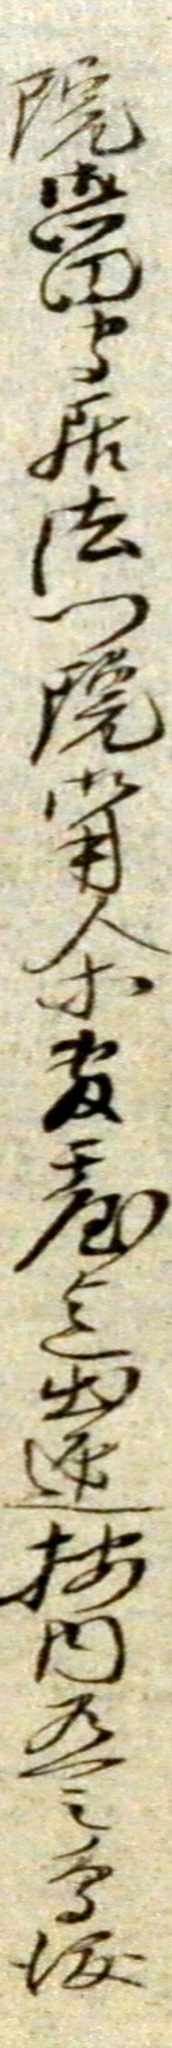院御留守居法門御用人抔敷臺迄出迎按内有之鳥渡
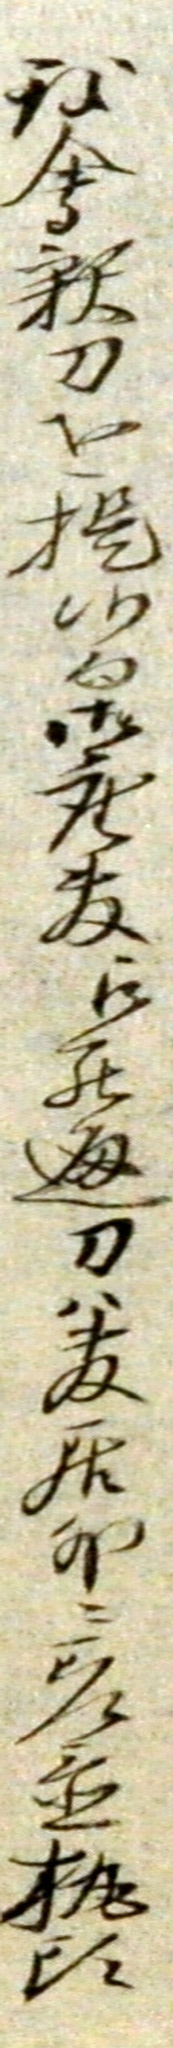致会釈刀提候而御座敷江罷通刀ㇵ敷居外二差置執頭
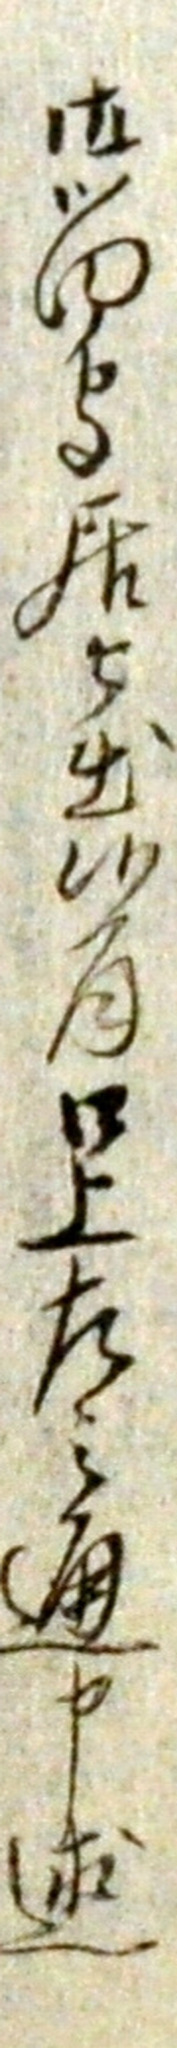御留守居ヒ出候間口上左之通申述

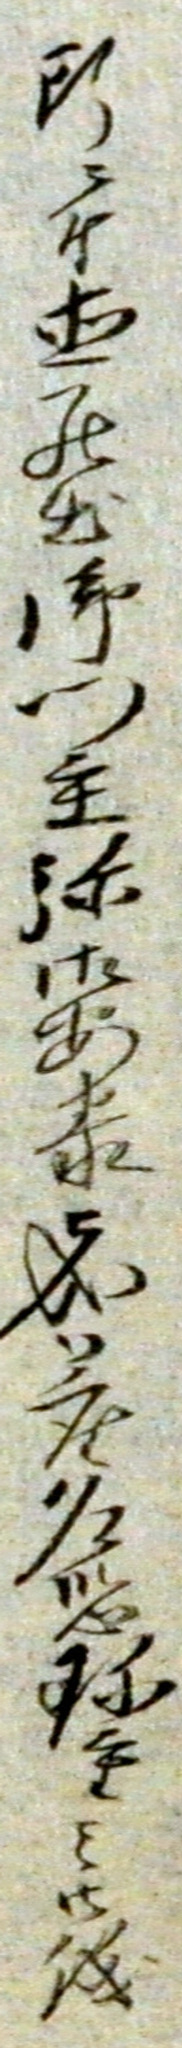断ニ付直罷出御門主弥御安泰ㇶ成御座乍恐珍重之御儀
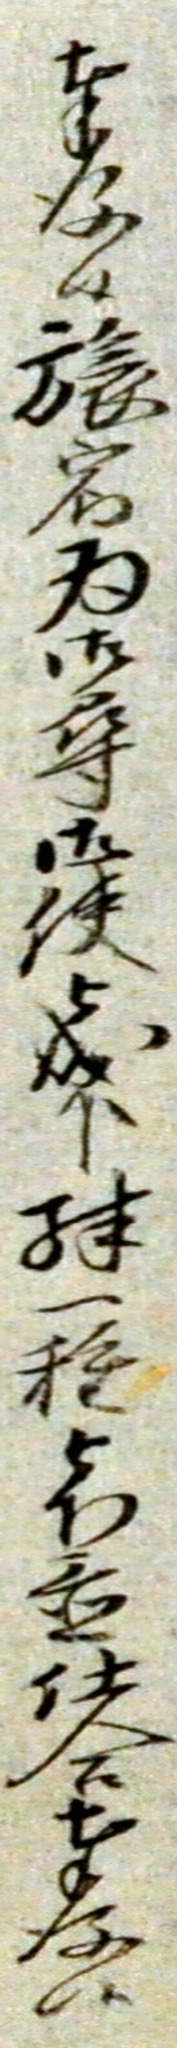奉存候旅宿為御尋御使ㇶ成下秣一種ヒ下置仕合奉存候
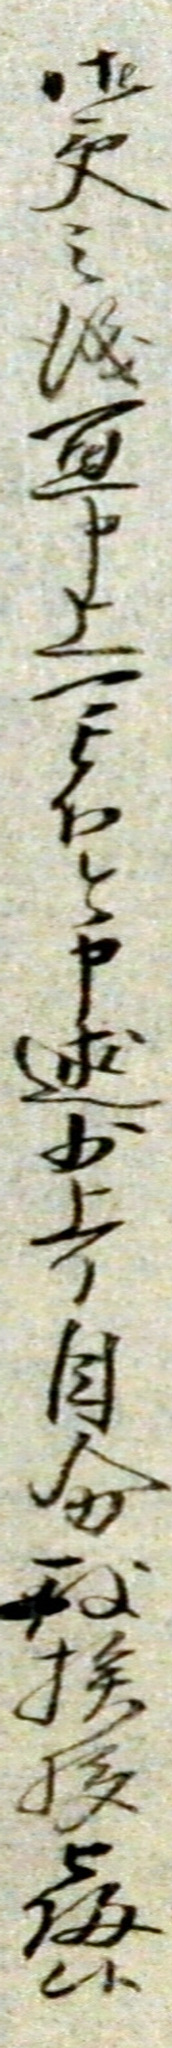御受之儀宜申上可ヒ下と申述少上り自分致挨拶ヒ帰候
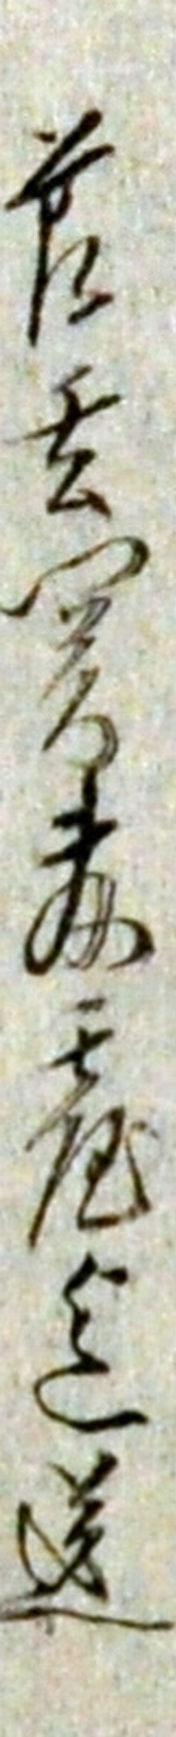節玄関敷臺迄送
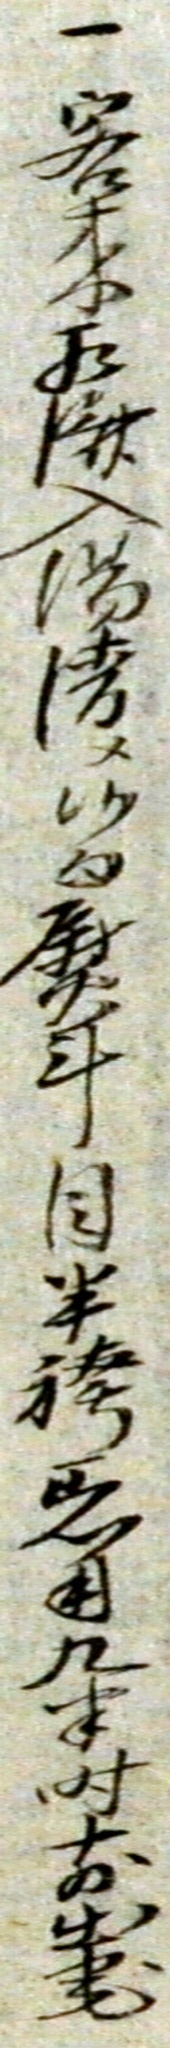一客来相済入湯清メ候而熨斗目半袴着用九半時前出宅
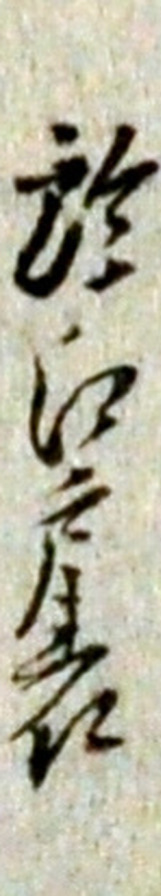於江戸表
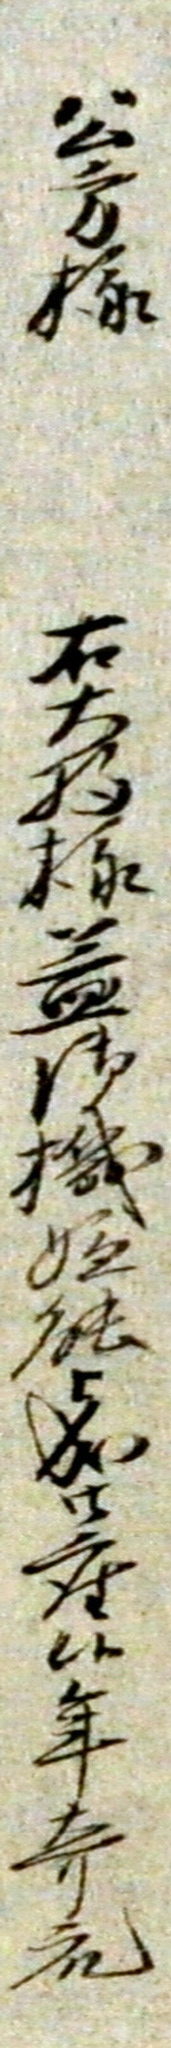公方様右大将様益御機嫌能ㇶ成御座候年寄衆
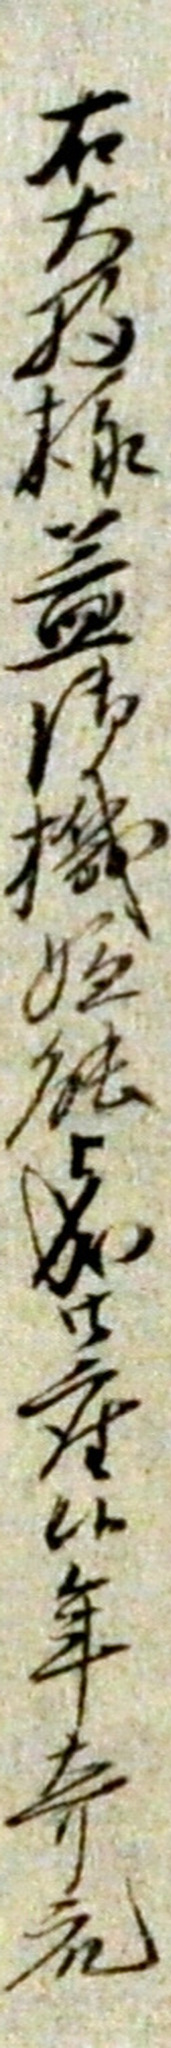公方様右大将様益御機嫌能ㇶ成御座候年寄衆
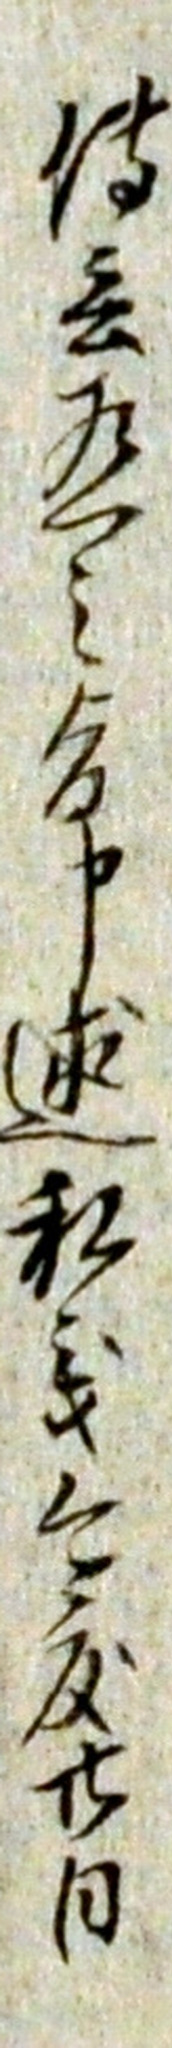伝言有之旨申述私義今度廿日
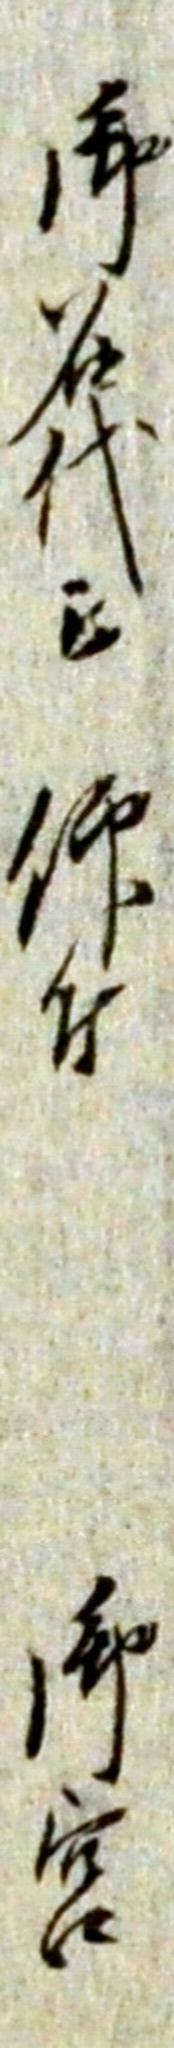御名代被仰付御宮
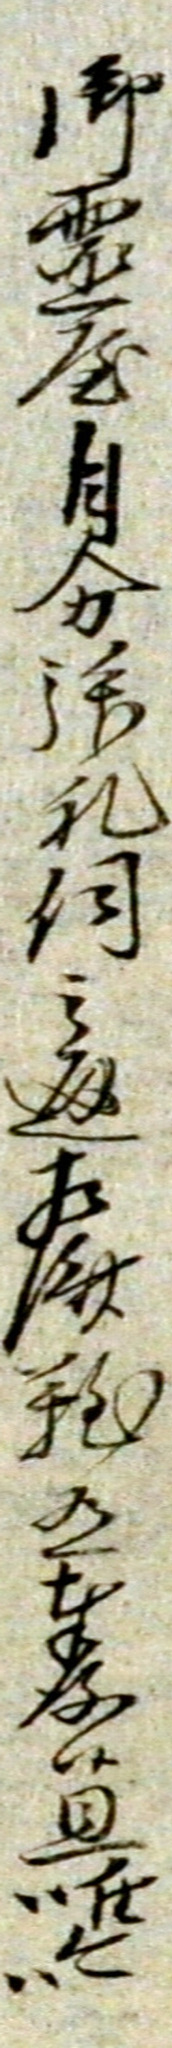御霊屋自分拝礼伺之通相済難有奉存候且唯今ㇵ
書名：日光御名代相勤候節ノ留
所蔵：伊那市立高遠町図書館・合同会社AMANE
